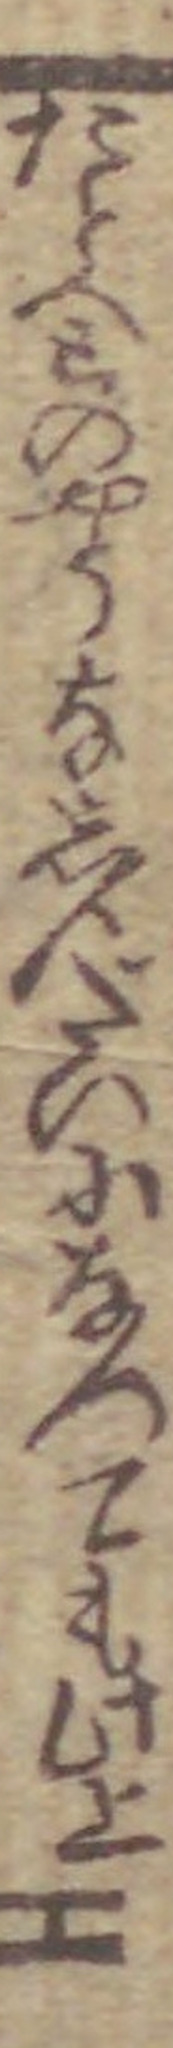たとへとのやうなしんだいになつてもも此上
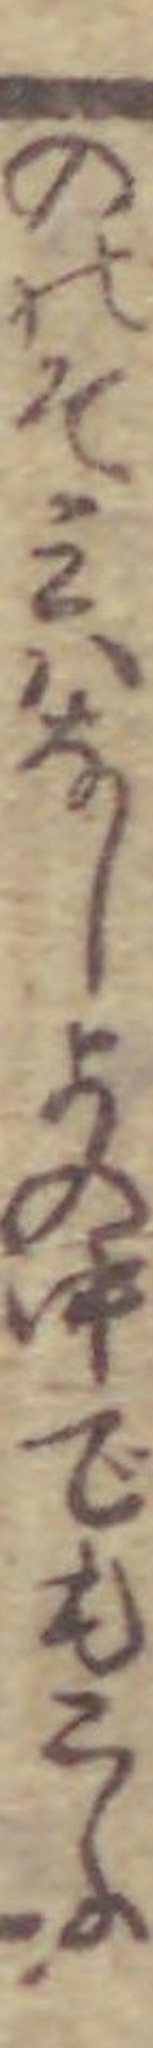ののそみはなしよの中でもこふ
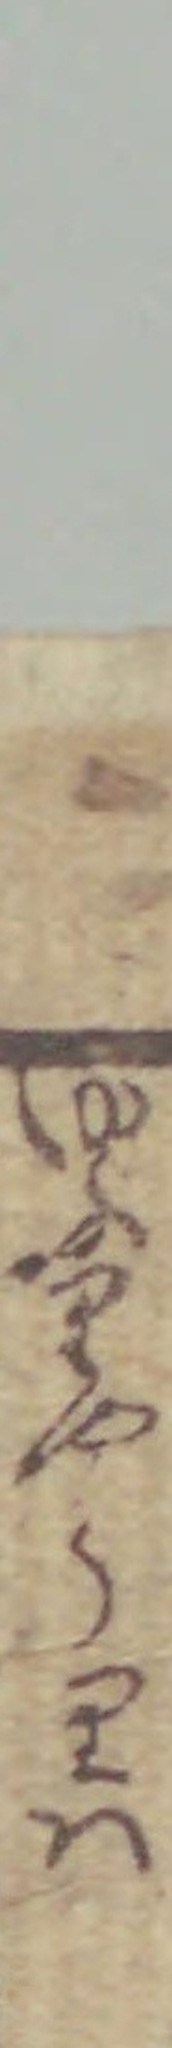ゆふりやうりは
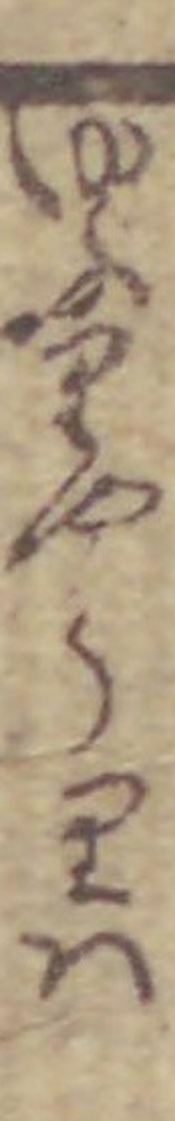ゆふりやうりは
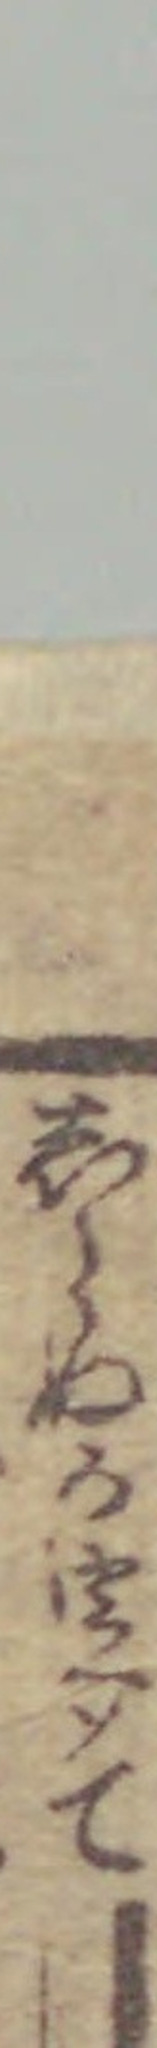しらぬか定メて
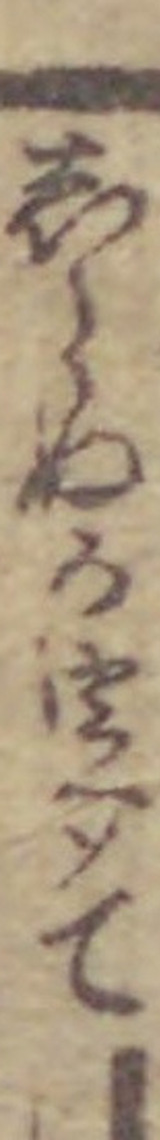しらぬか定メて
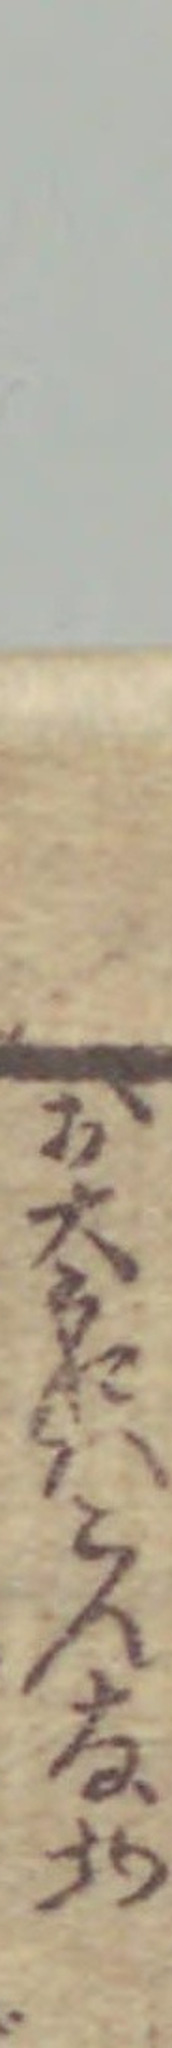お大名はこんな物
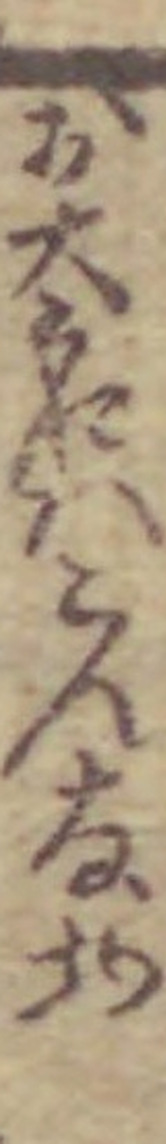お大名はこんな物
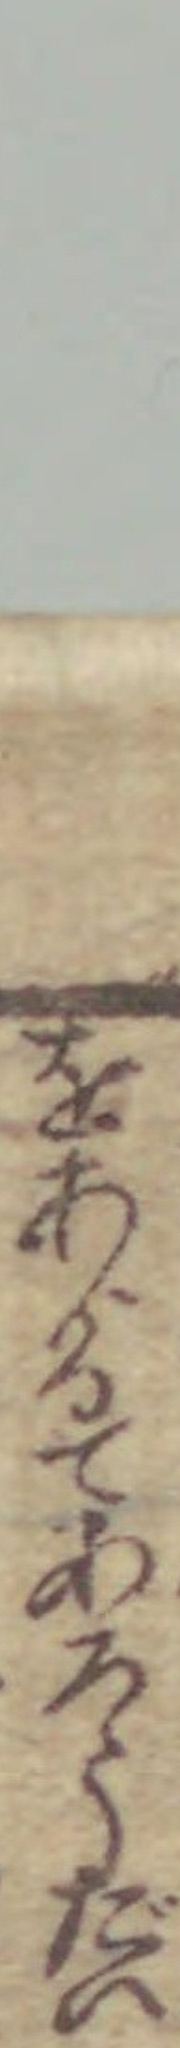をあがるてあろうだい
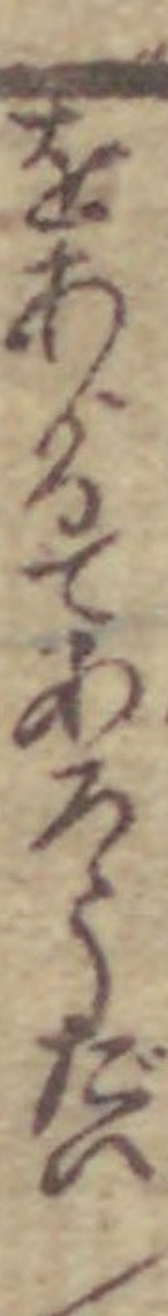をあがるてあろうだい
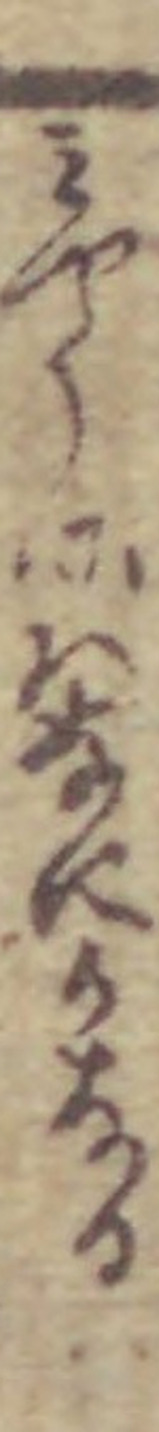みやうにはなにかなる
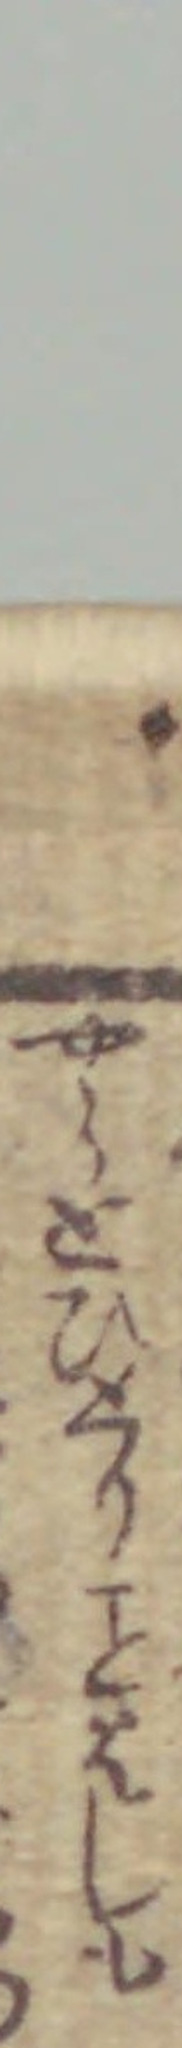やらとひとりことはしも
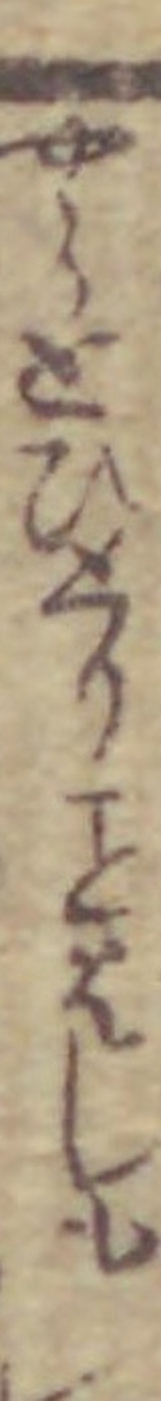やらとひとりことはしも
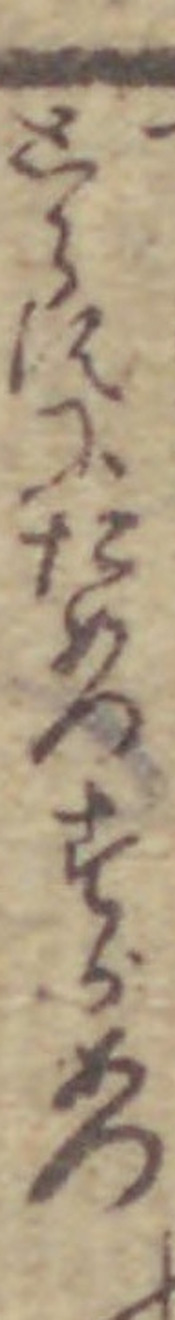とらすにためつすがめつ
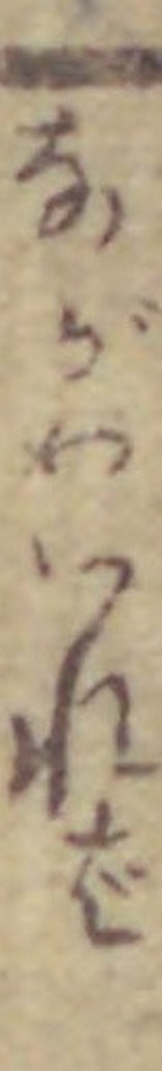ながめいれば
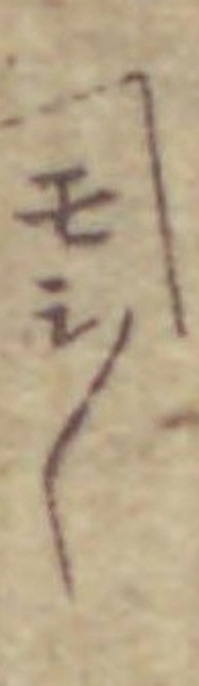〽モシ〳〵
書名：思事夢濃枕 3巻
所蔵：国立国会図書館 National Diet Library, JAPAN
